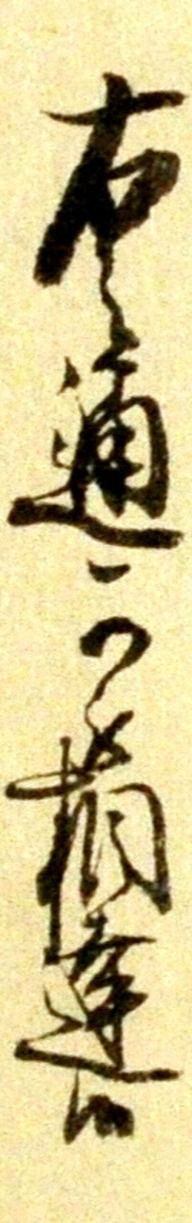右之通可被相達候
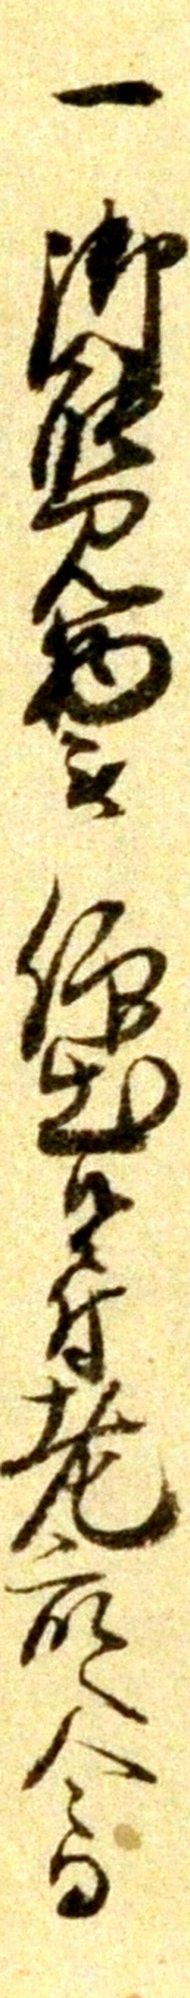一御能見物被仰出候ニ付老衆へ今日
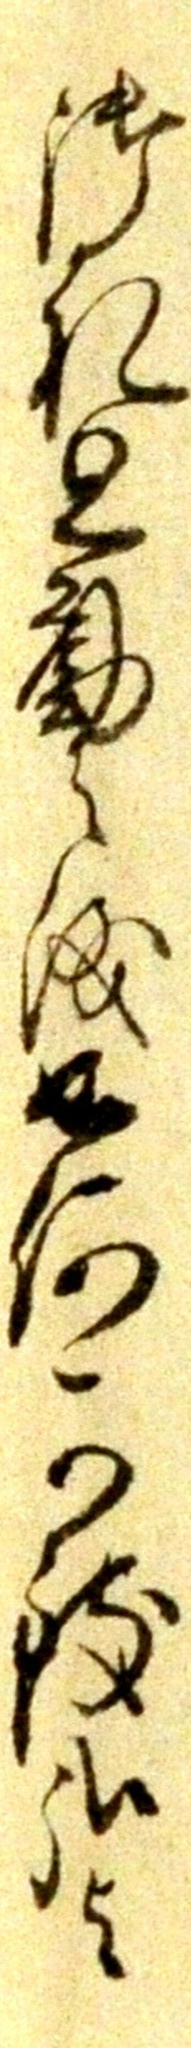御礼廻勤之儀如何可致哉と
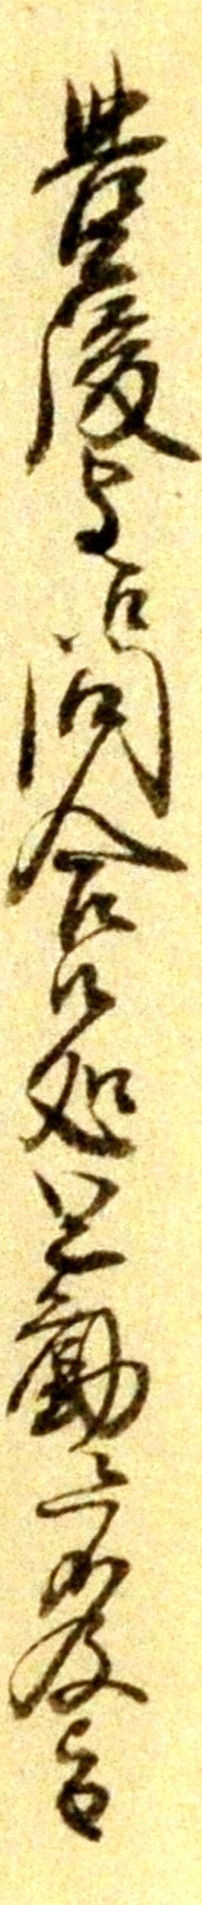豊後守え問合候処廻勤ニ不及旨
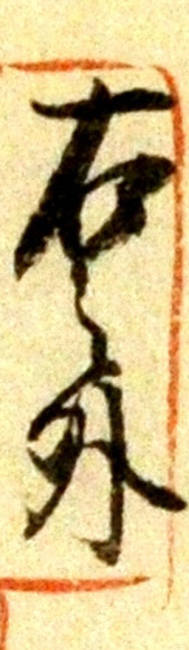右之外
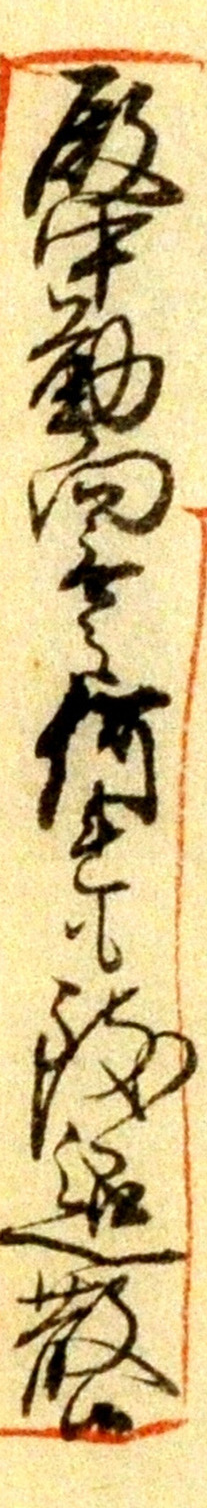殿中勤向無之何れも致退散候
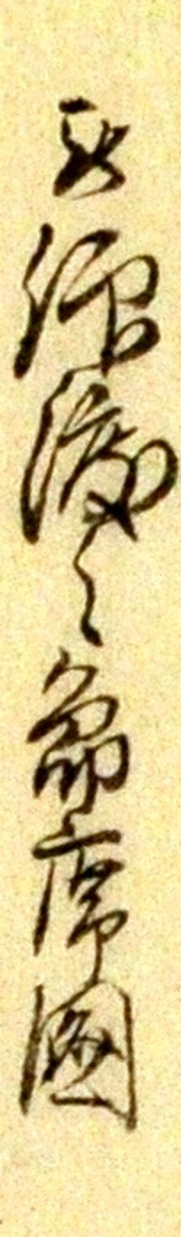被仰渡之節席図

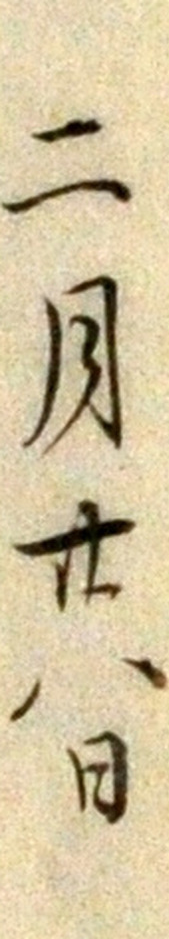二月廿八日
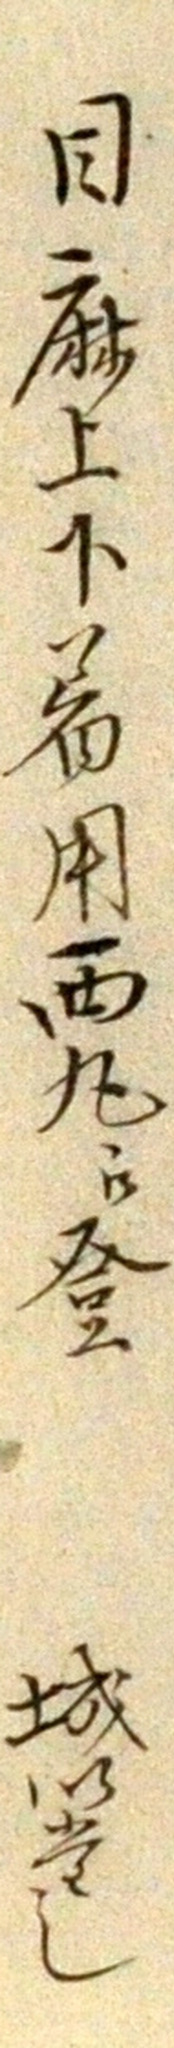目麻上下着用西丸江登城いたし
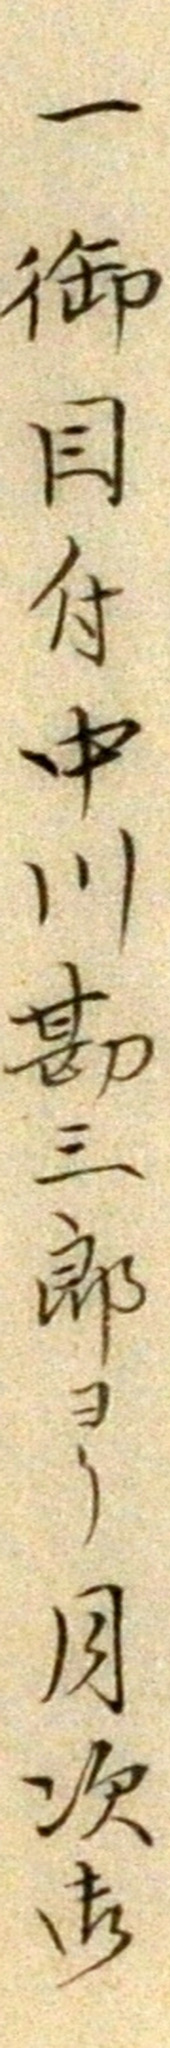一御目付中川勘三郎ヨリ月次御
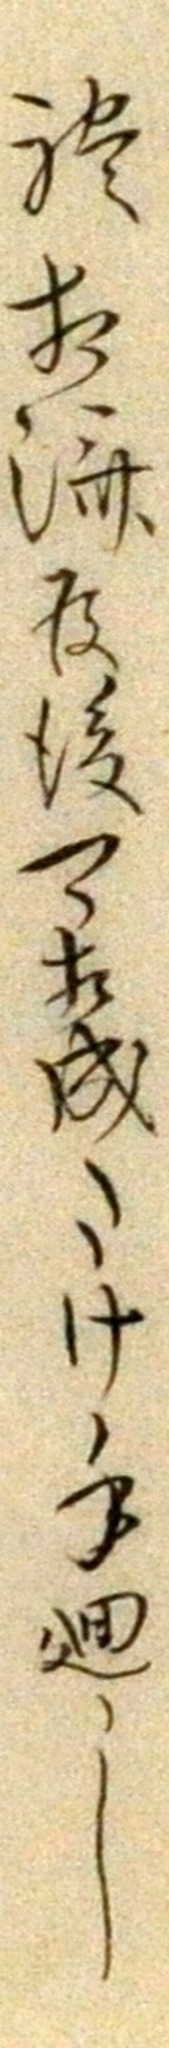礼相済候後可相成たけ手廻し
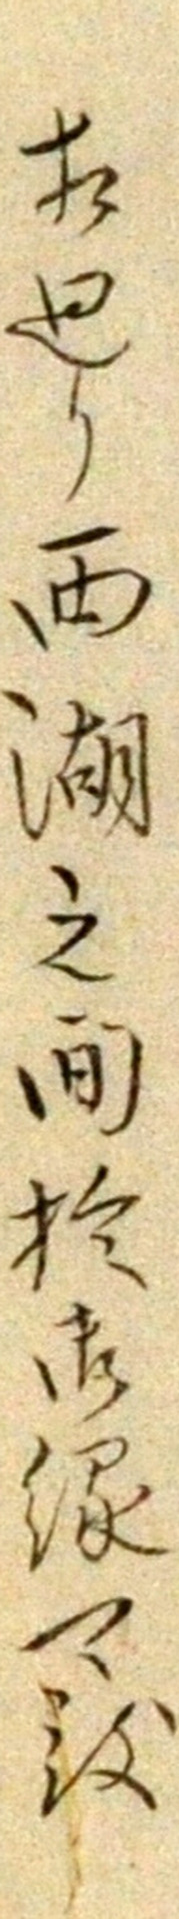相廻り西湖之間於御縁可致
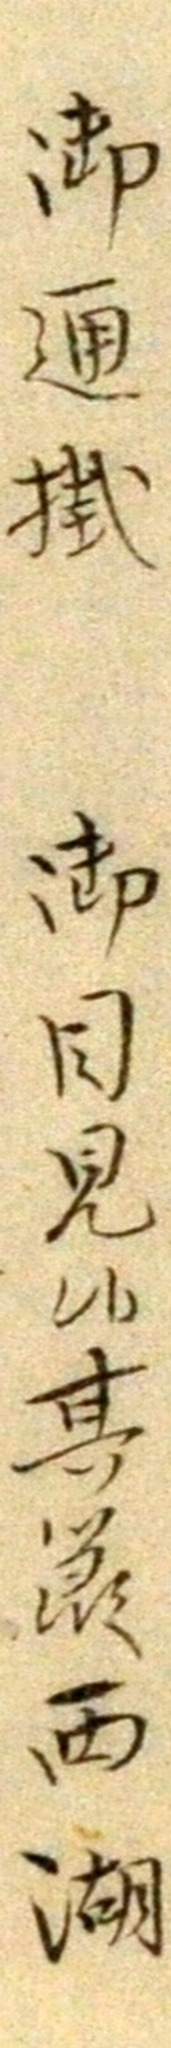御通掛御目見候其節西湖
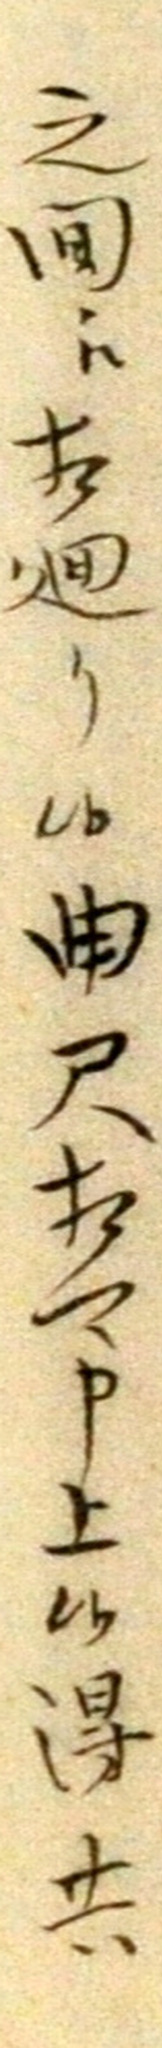之間江相廻り候曲尺相可申上候得共
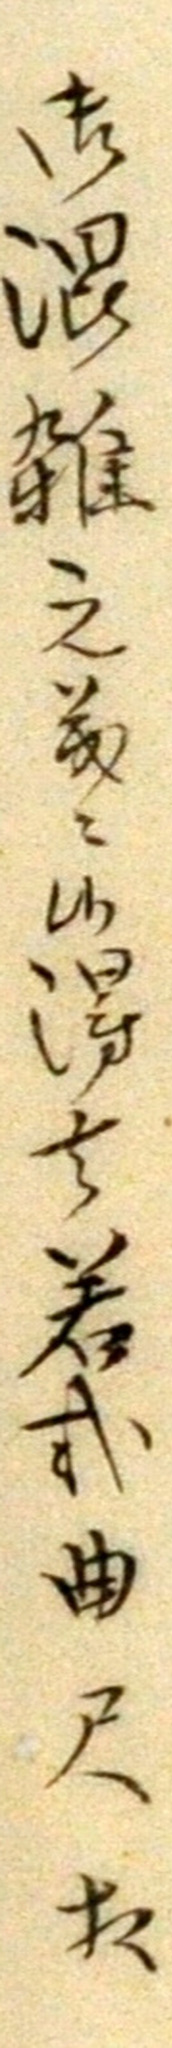御混雑之義ニ候得者若哉曲尺相
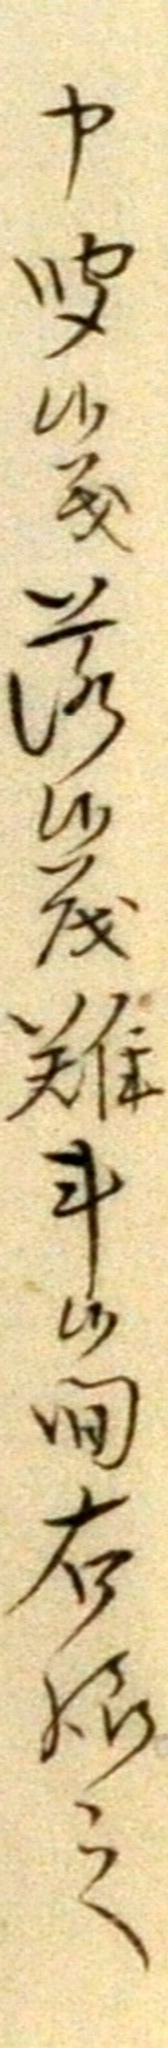申聞候義落候も難計候間右様之
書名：御移徒相済御祝儀御能ノ節ノ留外
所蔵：伊那市立高遠町図書館・合同会社AMANE
